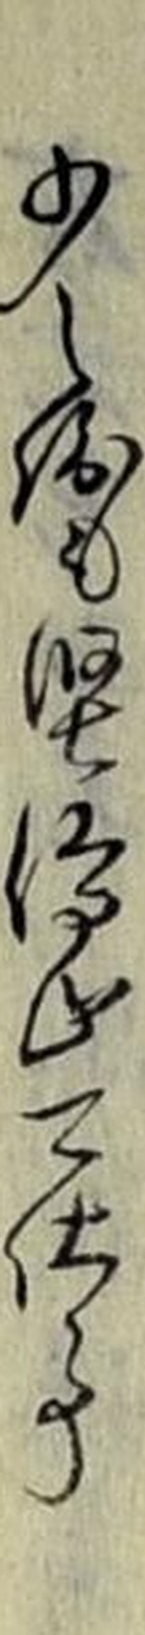少之儀も堅停止可仕事
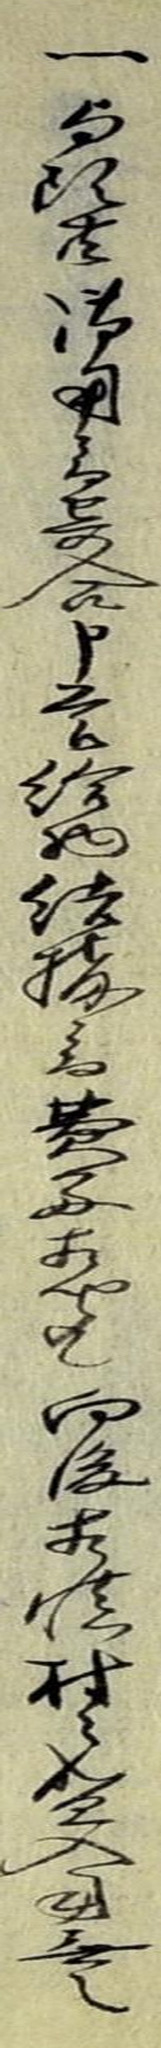一与頭共御用ニ而寄合申節給物結構ニ而費多相聞候向後相慎村々盛入用無之
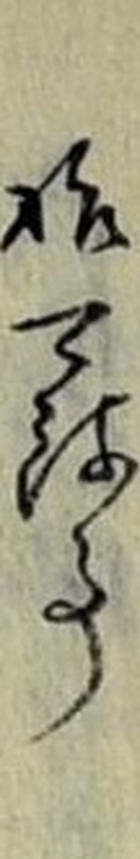様可致事
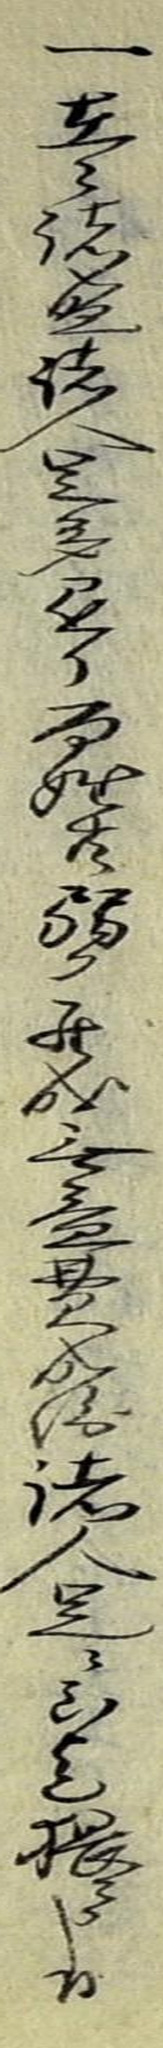一在々諸盛諸人足多懸り百姓共弱ク罷成無益費成儀諸人足ニ至迄猥ニ申付
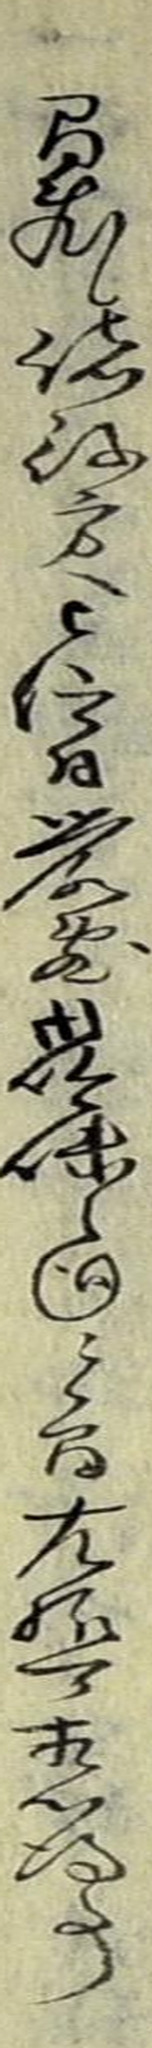間敷候諸役方へ被仰付厳敷御吟味之趣ニ候間左様可相心得事
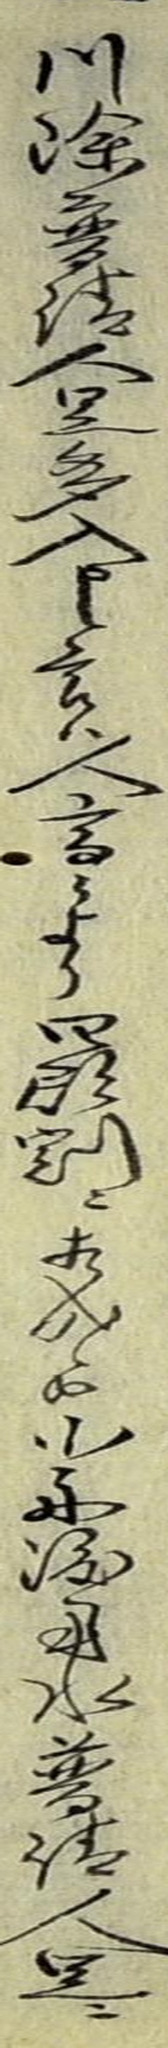一川除普請人足多入申節ハ人高ニより四郡割ニ相成候由小舟渡用水普請人足ニ
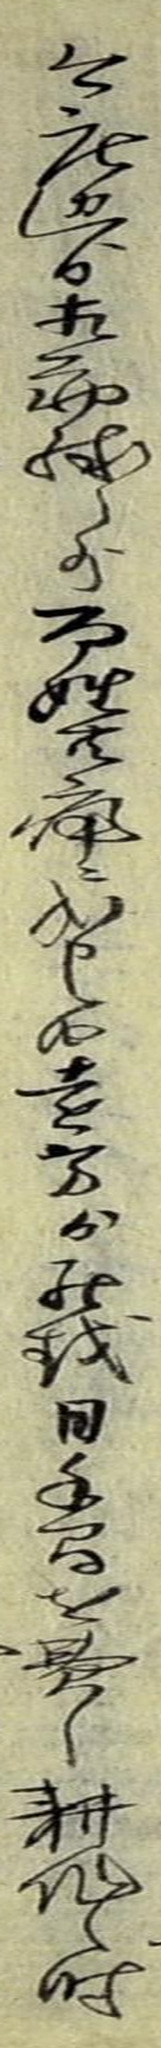今庄辺ゟ相勤殊之外百姓共痛ニ成申候由遠方ゟ罷越日手間を費し耕作之時
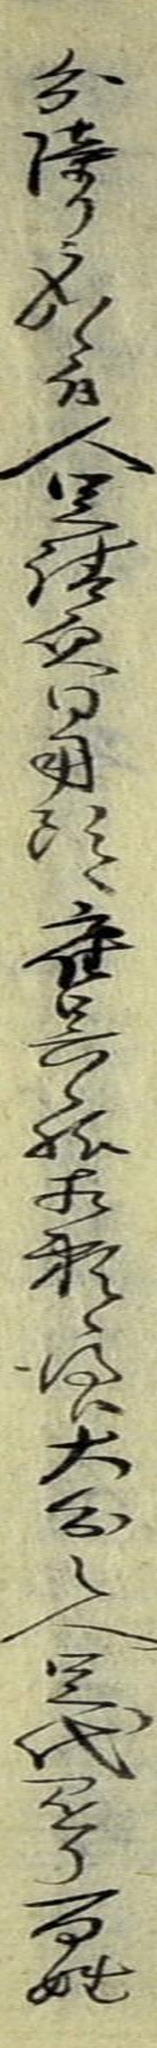分障りニ成候ニ付人足請負日用頭へ雇呉候様相頼候得ハ大分之人足代懸り百姓
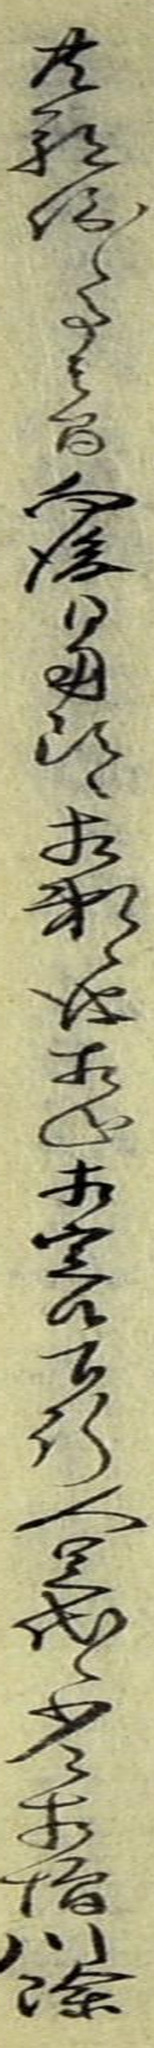共難儀之事ニ候間向後日用頭へ相頼候儀相止相定候下行？人足代へ少々相増川除

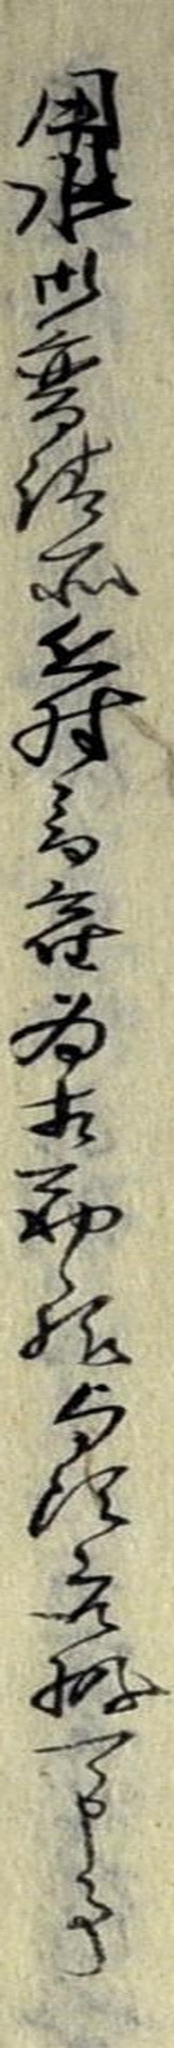用水御普請所近村ニ而雇為相勤候様与頭取扱可申事
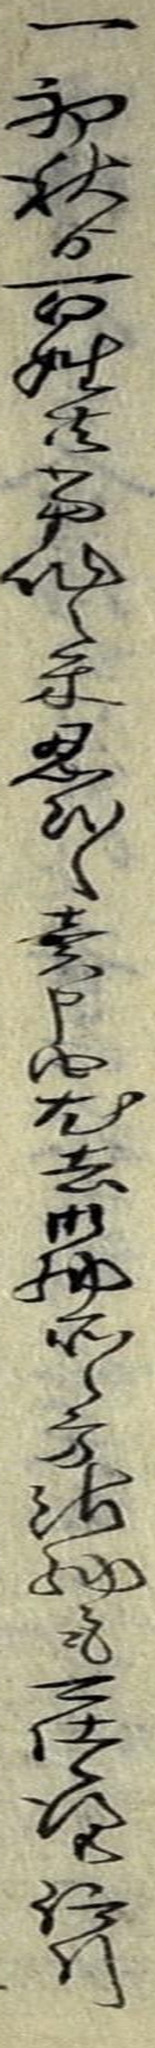一初秋ゟ百姓共当作之米忍ひ〳〵売申由尤去御納所之方銀納ニも可仕候得共跡引
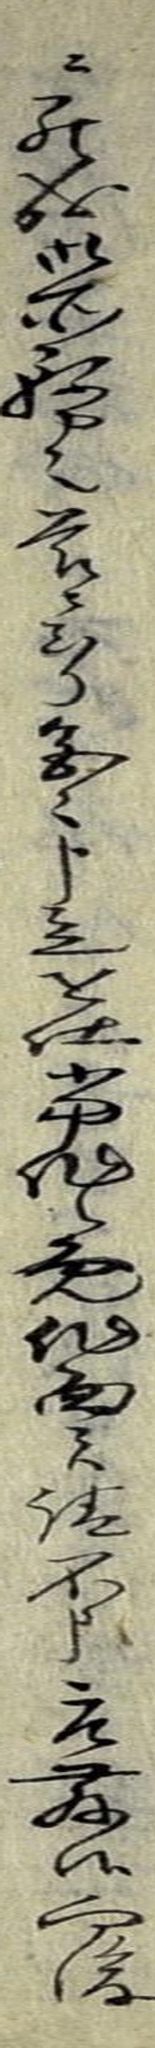ニ罷成御所務之節ニ至り色々申立を仕当作之免作面ニハ請不申取散候向後
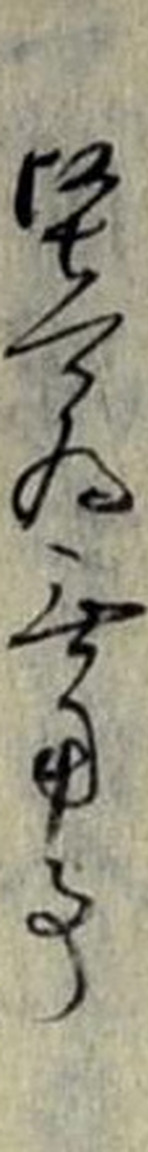堅可為無用事
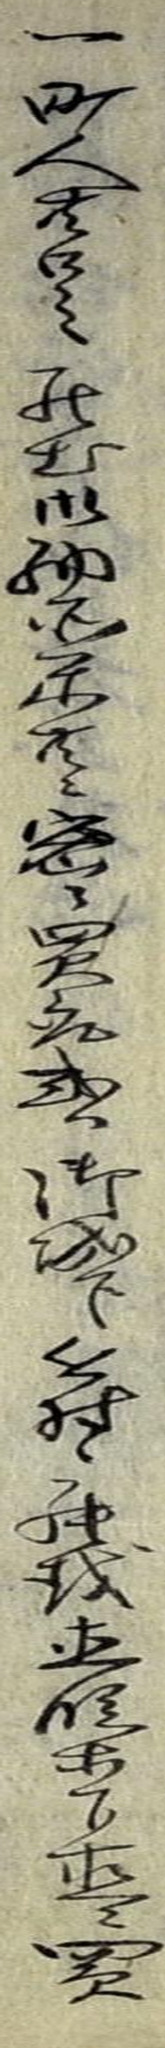一町人共口々へ罷出御納所米共ニ密々買取或ハ御城下近村へ罷越直段等下直ニ買
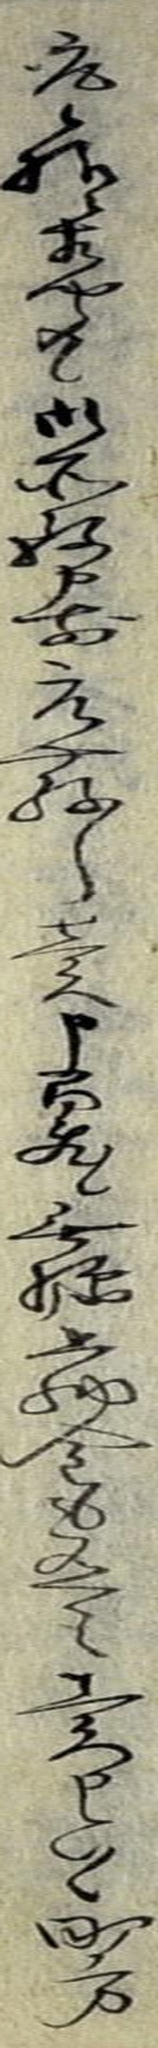取候様ニ相聞候御所務前取散し売申間敷候無拠上納金も有之売申候ハヽ町方
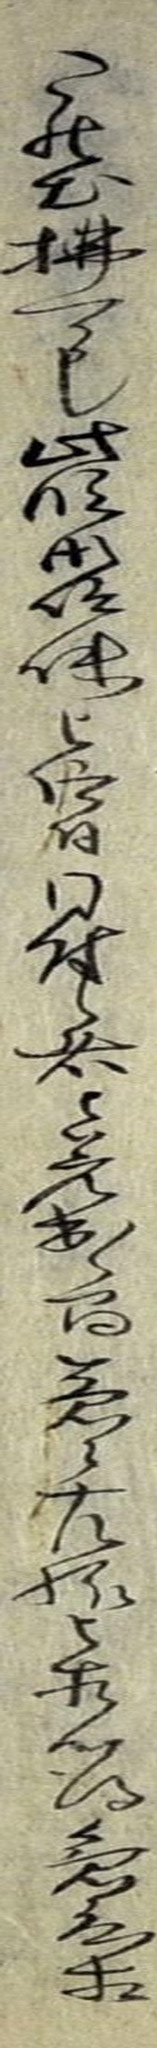へ罷出払可申候此段御吟味被仰付目付之者被差出候間兼々左様被相心得急度相
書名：命令之部 一
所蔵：福井県文書館 Fukui Prefectural Archives
